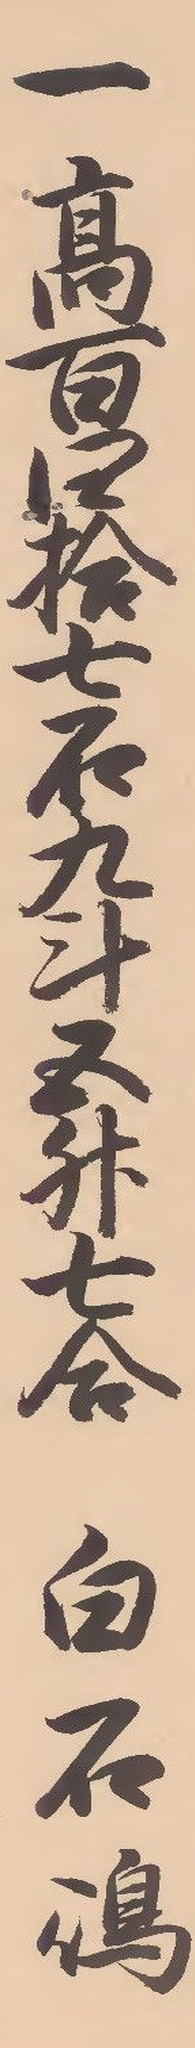一高百四拾七石九斗五升七合白石島

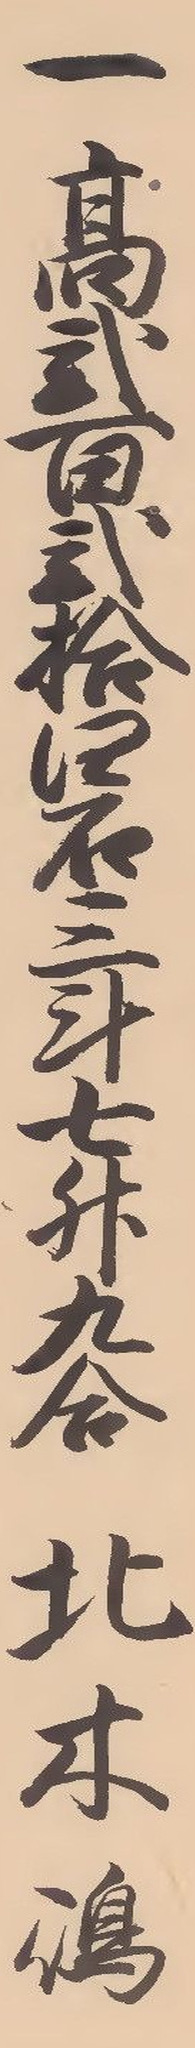一高弐百弐拾四石三斗七升九合北木島
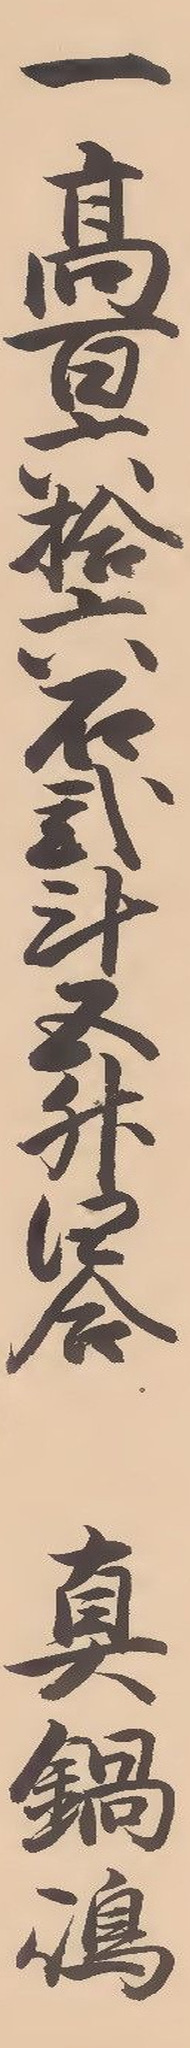一高百六拾六石弐斗五升四合真鍋島
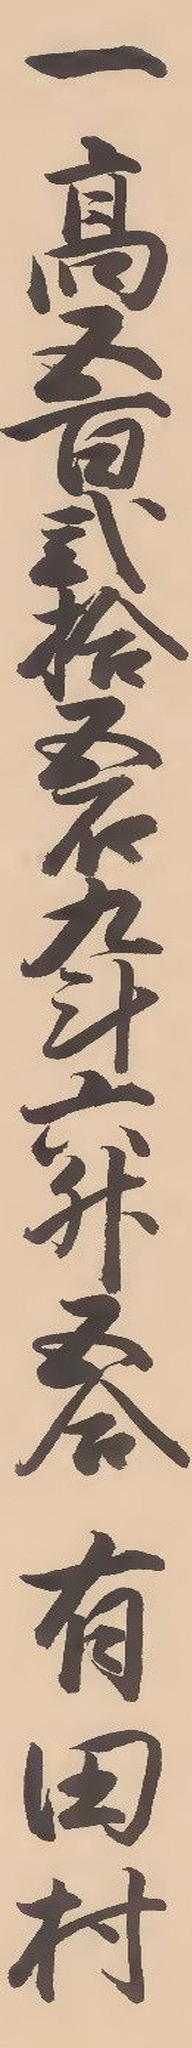一高五百弐拾五石九斗六升五合有田村
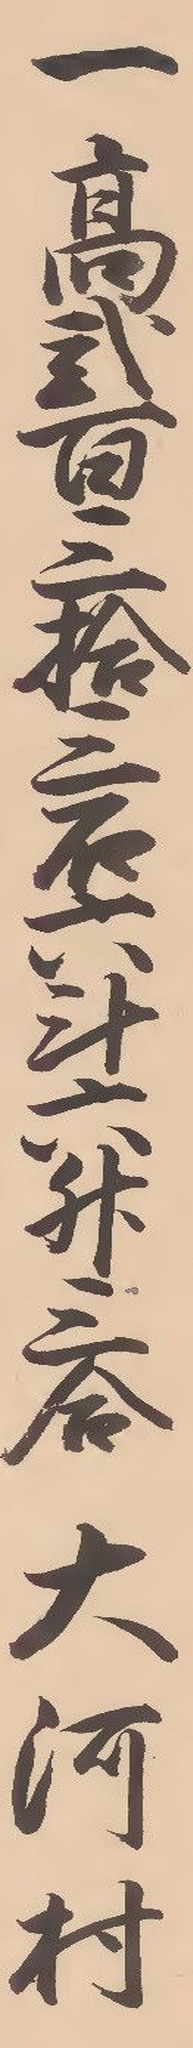一高弐百三拾三石六斗六升三合大河村
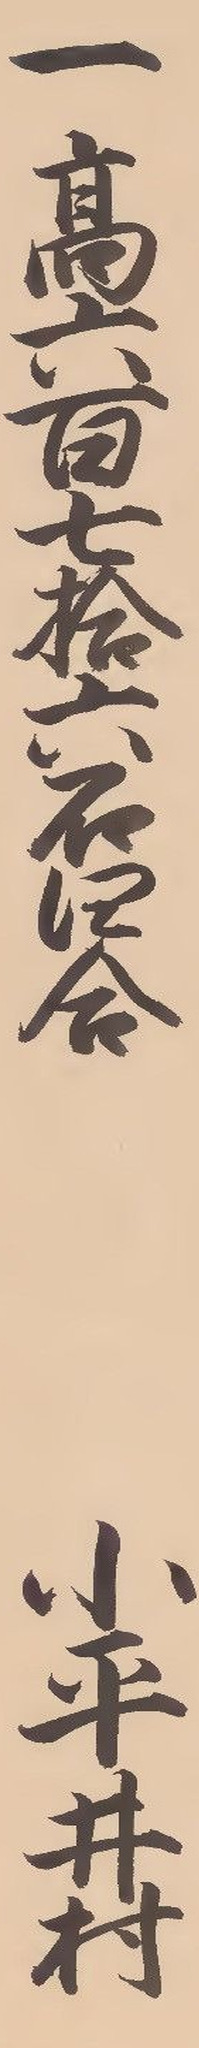一高六百七拾六石四合小平井村
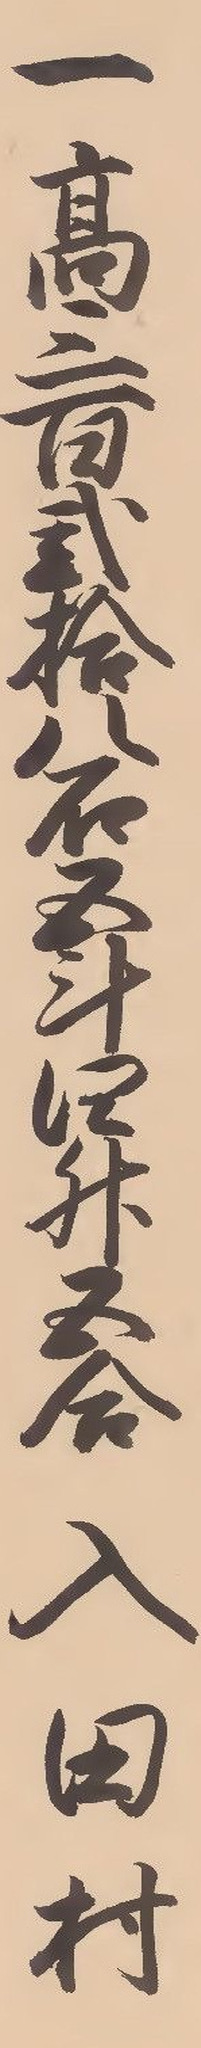一高三百弐拾八石五斗四升五合入田村
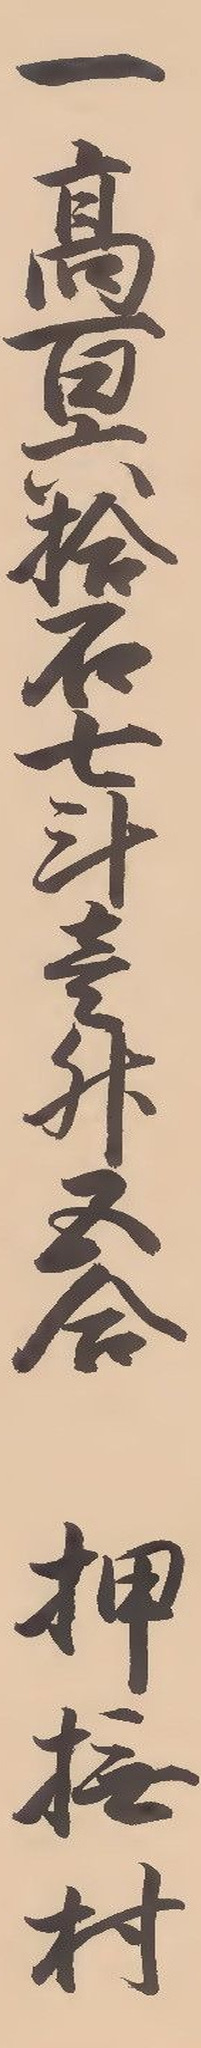一高百六拾石七斗壱升五合押撫村
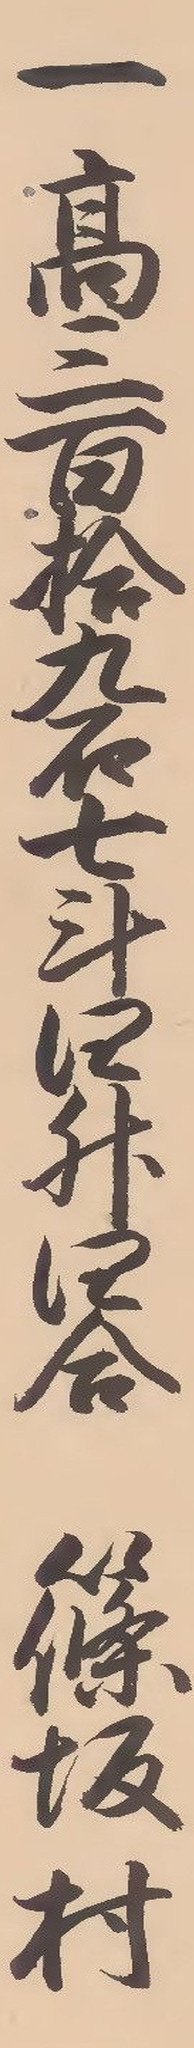一高三百拾九石七斗四升四合篠坂村

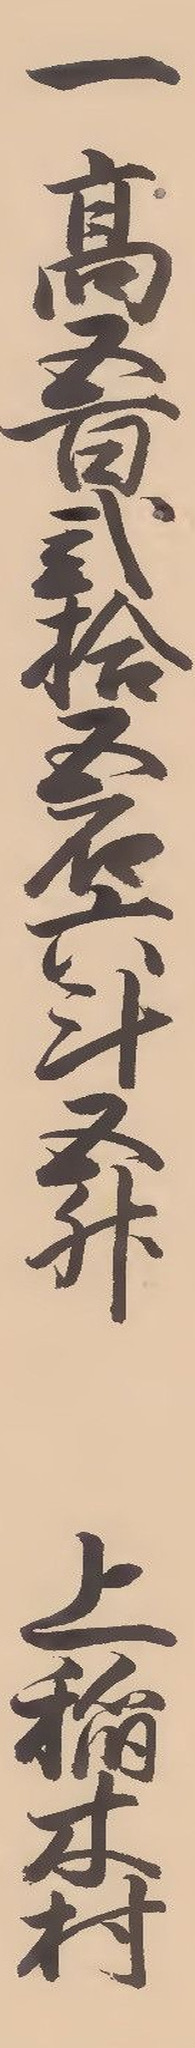一高五百弐拾五石六斗五升上稲木村
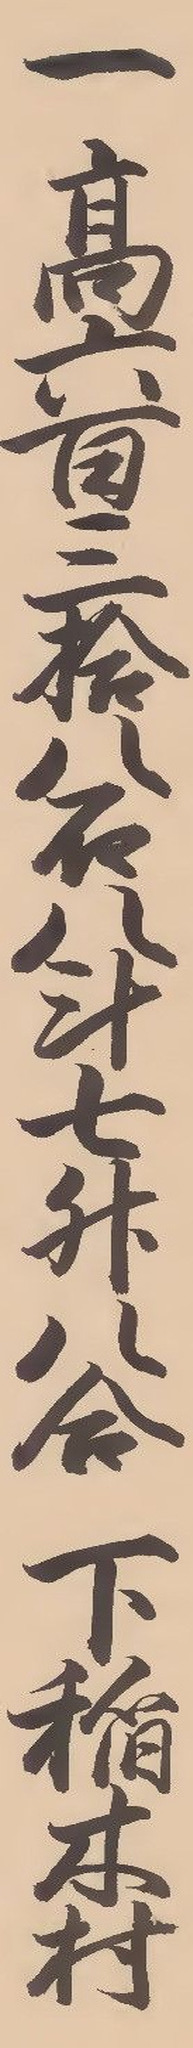一高六百三拾八石八斗七升八合下稲木村
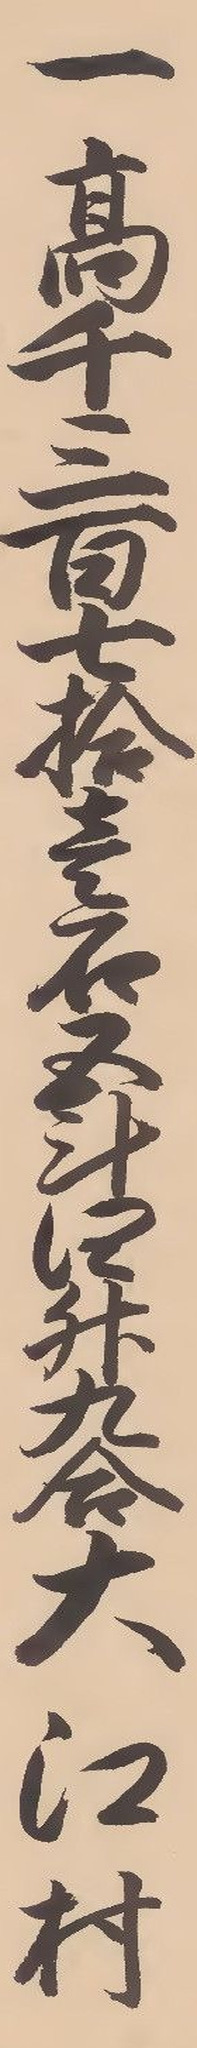一高千三百七拾壱石五斗四升九合大江村
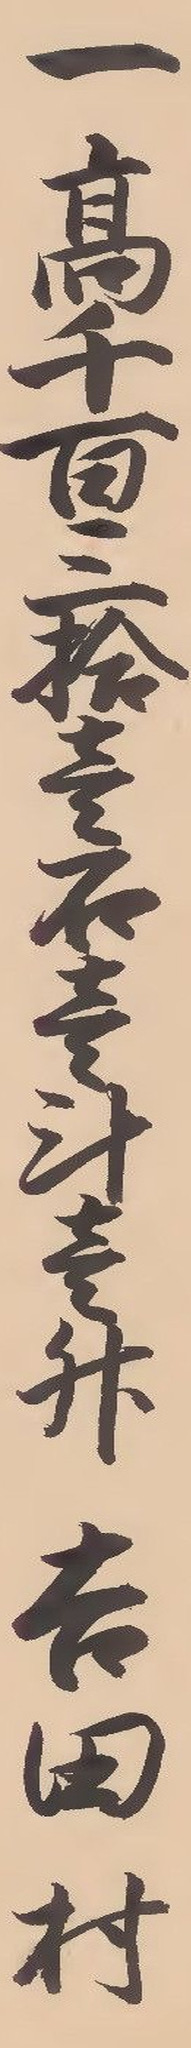一高千百三拾壱石壱斗壱升吉田村
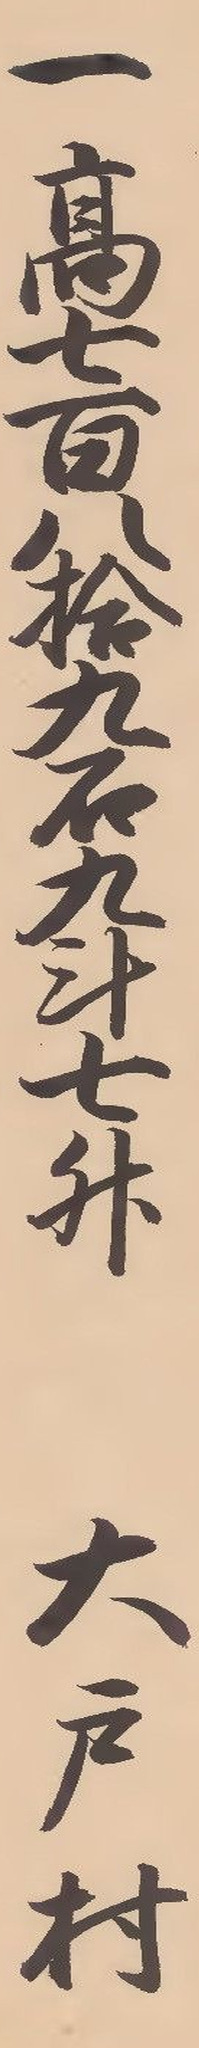一高七百八拾九石九斗七升大戸村
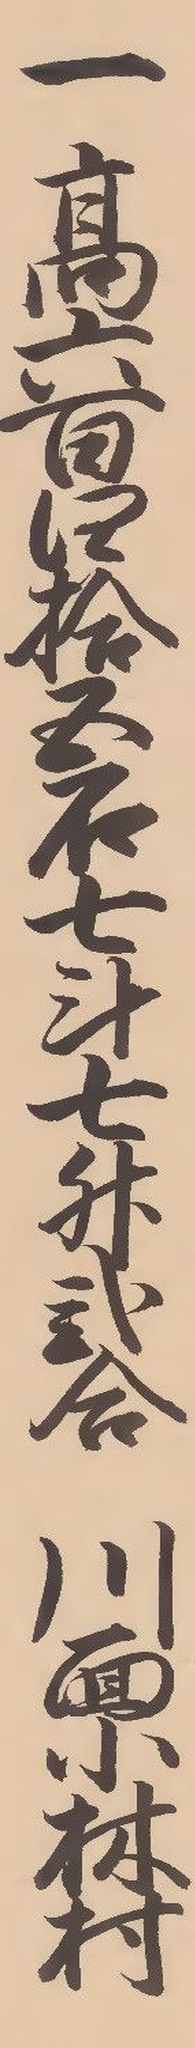一高六百四拾五石七斗七升弐合川面小林村
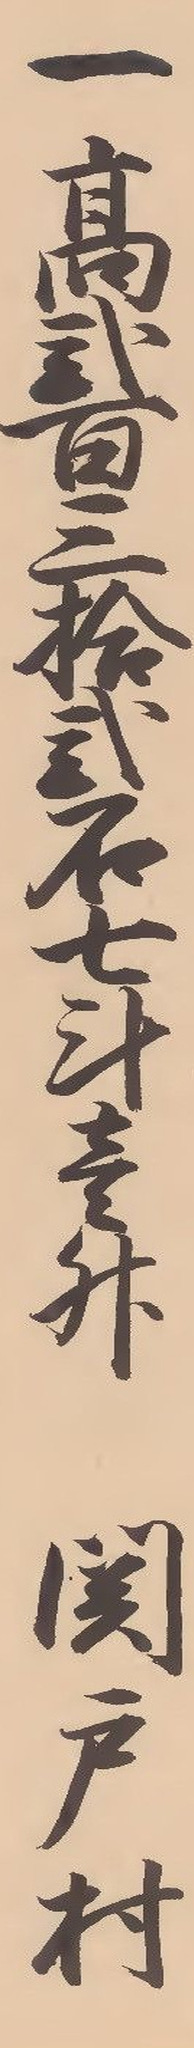一高弐百三拾弐石七斗壱升関戸村
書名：備中国郷帳
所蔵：国立公文書館 National Archives of Japan
